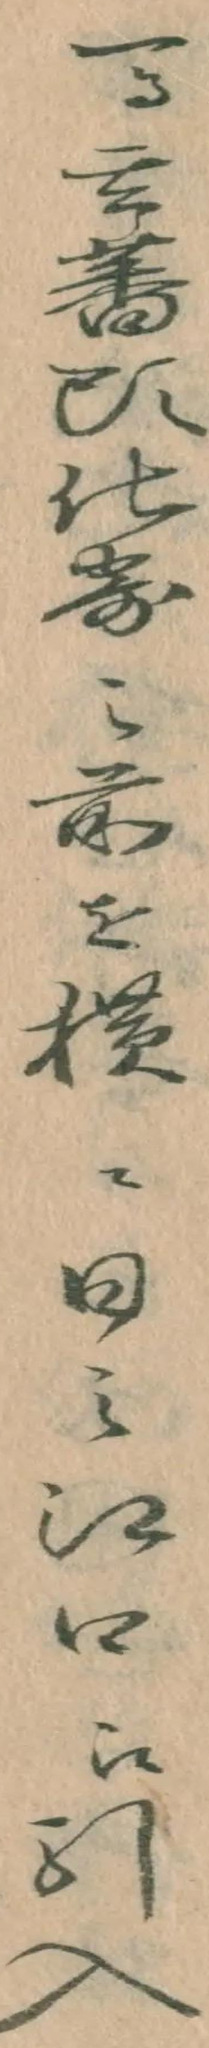馬玄蕃頭仕寄之前を横に日之江口江引入
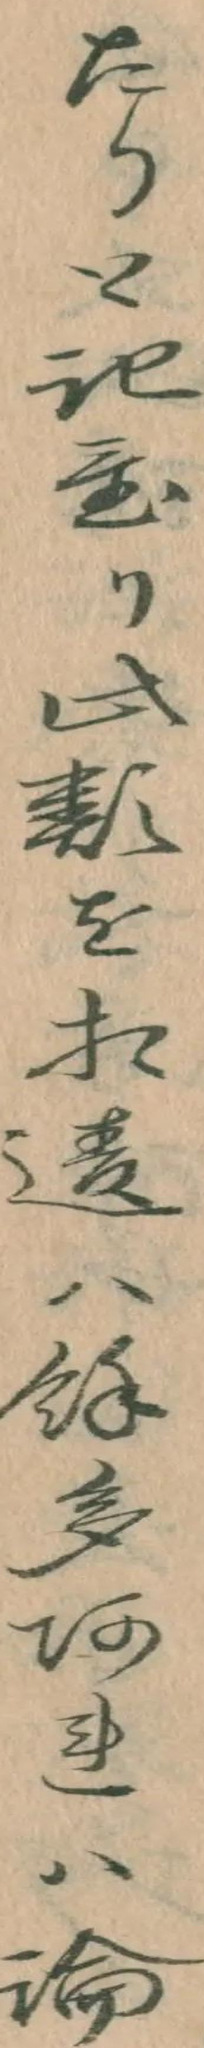たりと記置り此類を相違は余多阿連は論
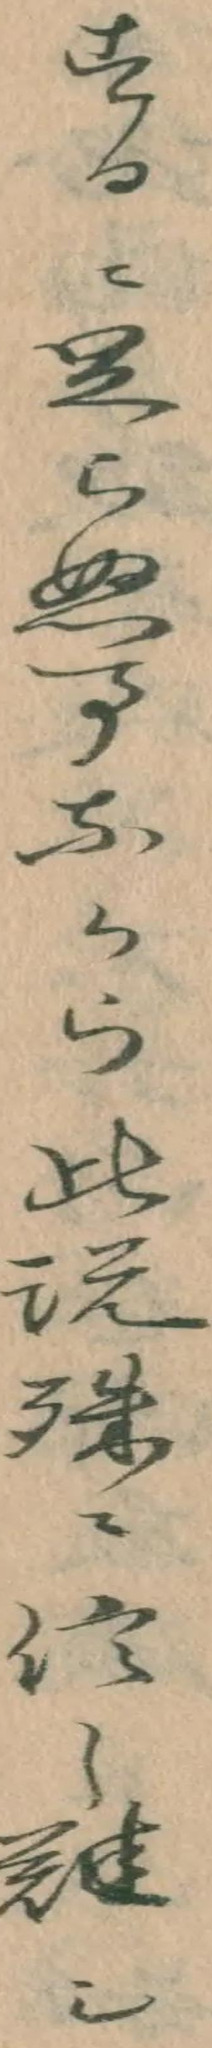春るに足ら怒事なから此説殊に信し難し
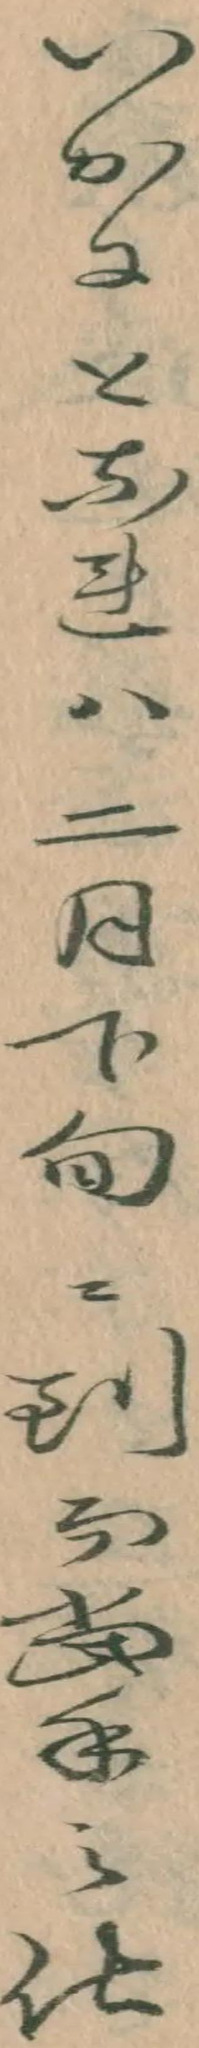いか尓とな連は二月下旬に到而当手之仕
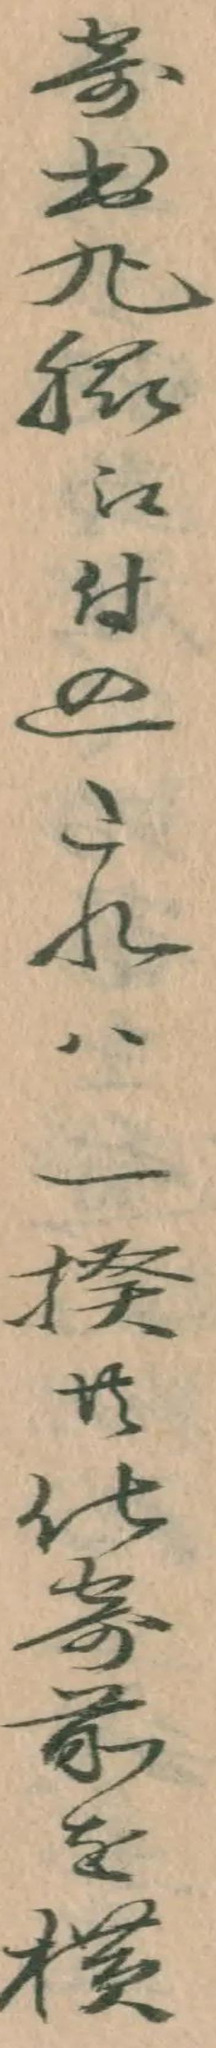寄出丸脇江付込たれは一揆共仕寄前を横
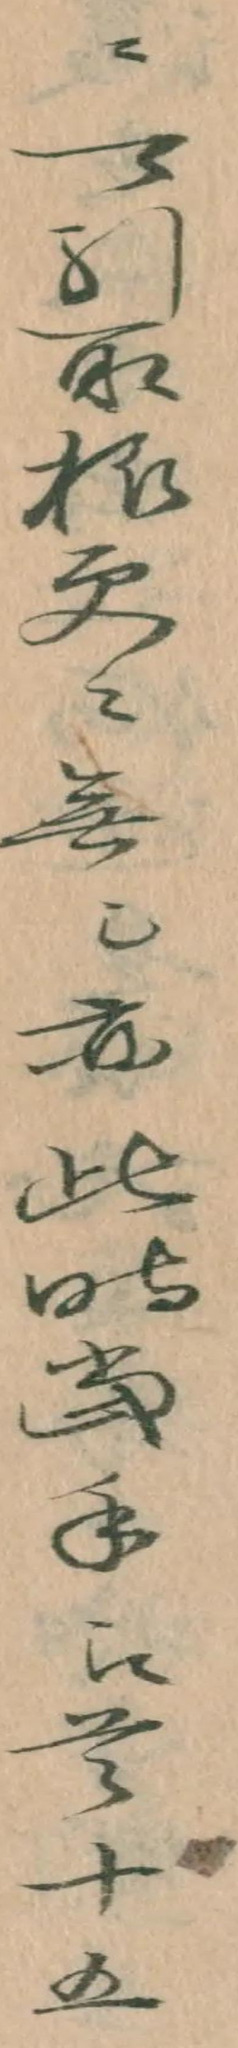に可引取様更に無し亦此時当手江首十五
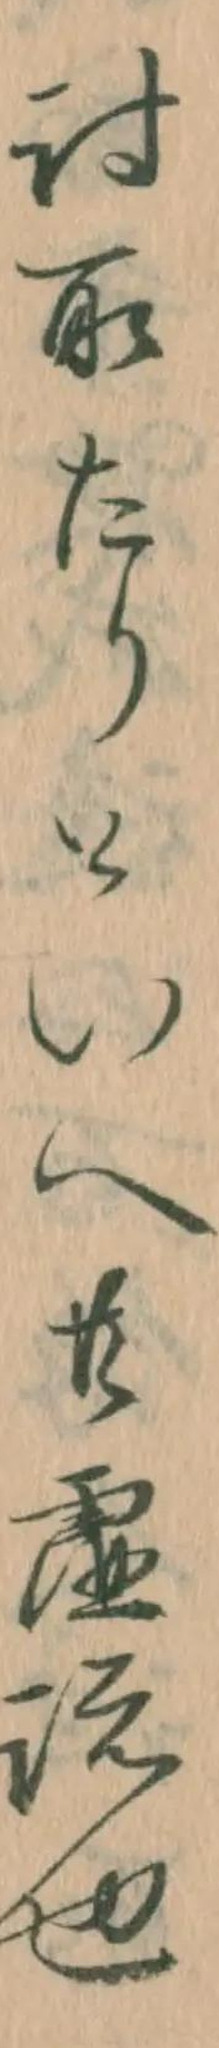討取たりといへ共虚節也
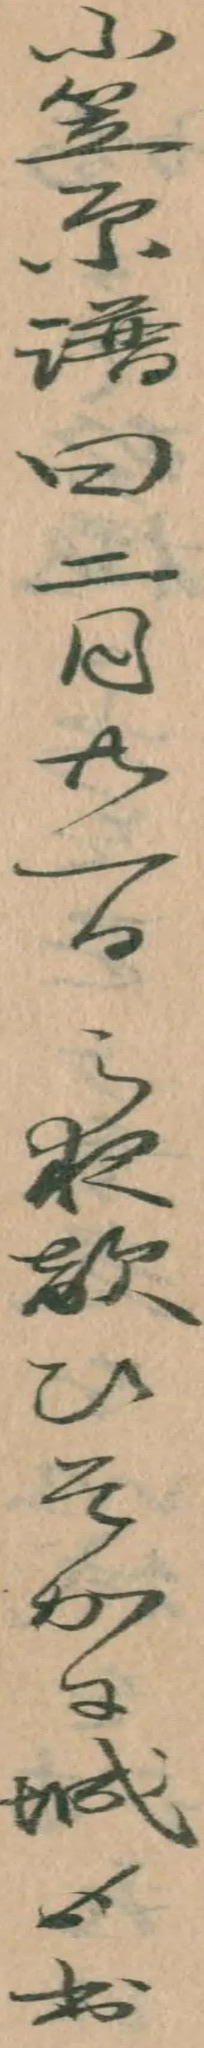小笠原譜曰二月廿一日之夜敵ひそか尓城ゟ出
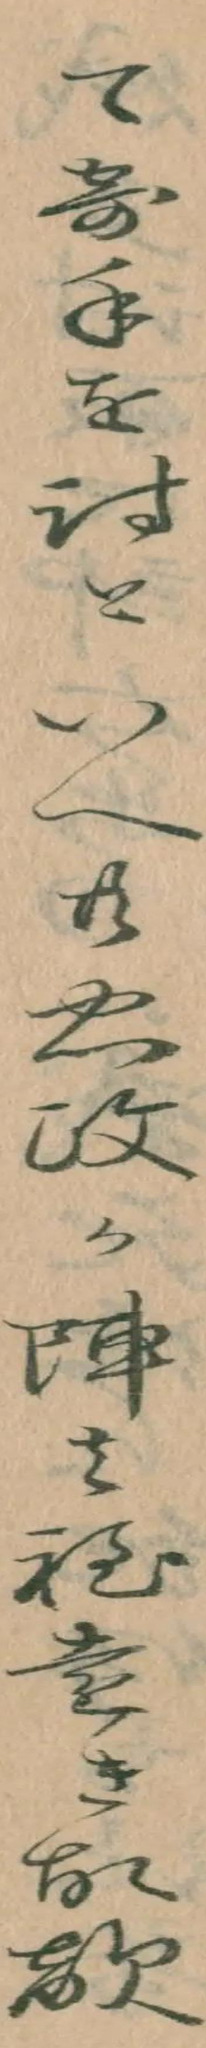て寄手を討といへ共火攻か陣者程遠き故敵
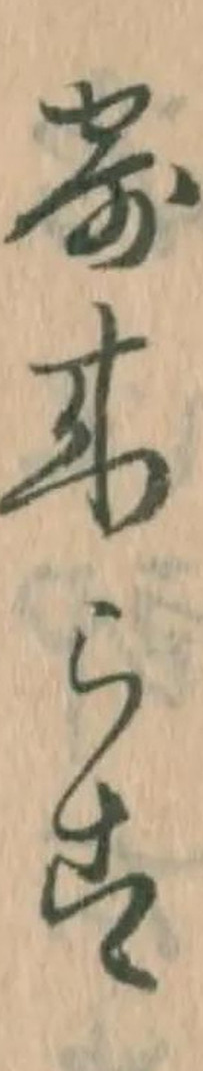寄来ら春
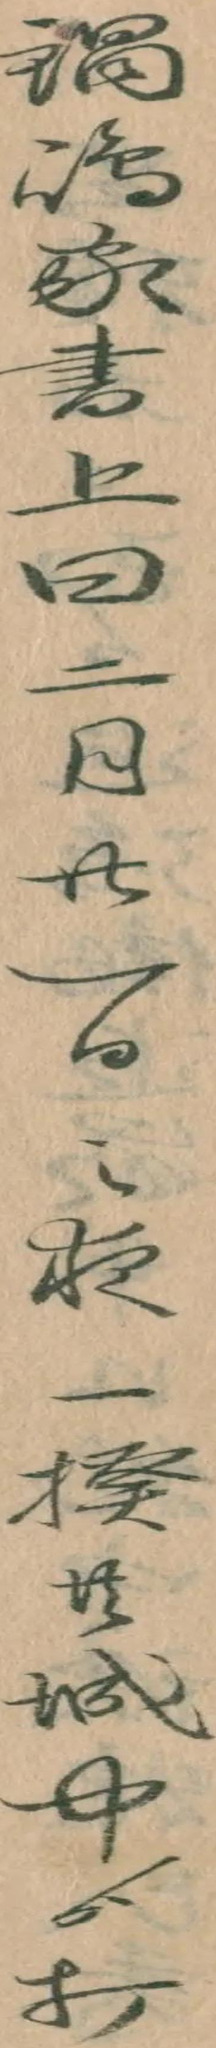鍋島家書上曰二月廿一日之夜一揆共城中ゟ打
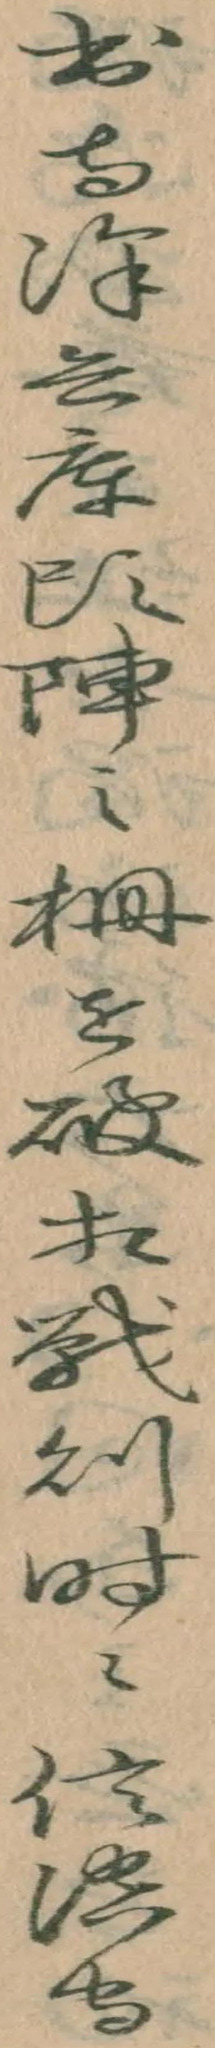出寺沢兵庫頭陣之柵を破相戦則時に信濃守
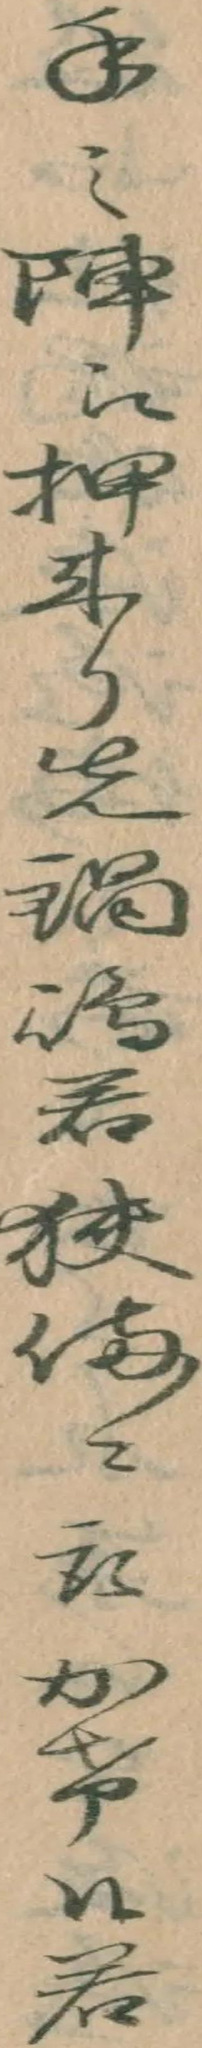手之陣江押来り先鍋島若狭備に取か希候若
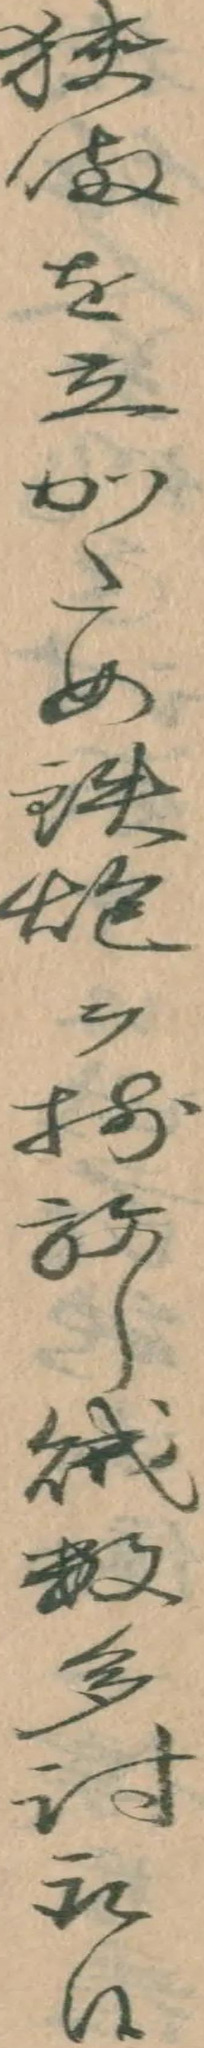狭備を立かため鉄炮を揃放し賊数多討取候
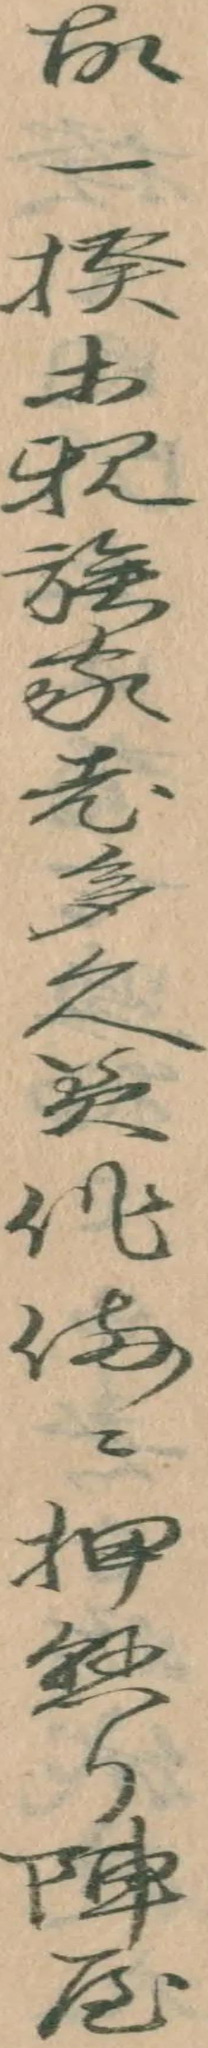故一揆等親族家老多久美作備に押懸り陣屋
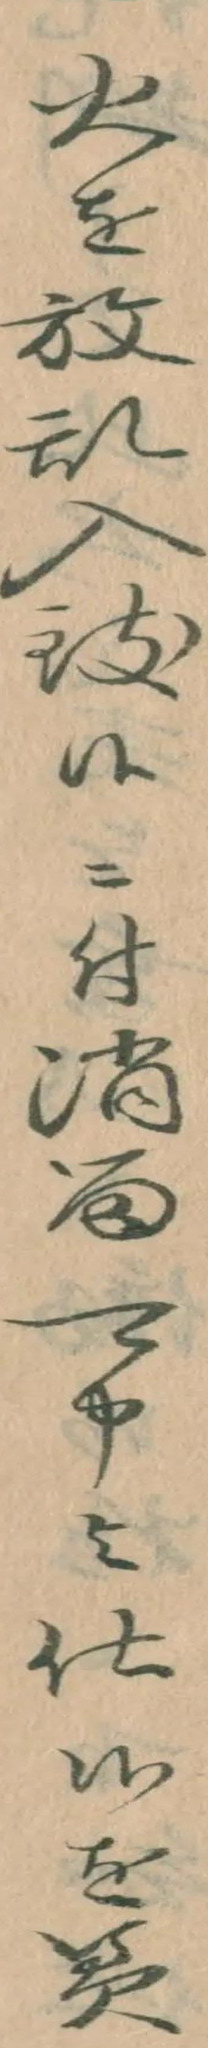に火を放乱入致候に付消留可申与仕候を美
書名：切支丹御退治記 49巻. [7]
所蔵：国立国会図書館 National Diet Library, JAPAN
